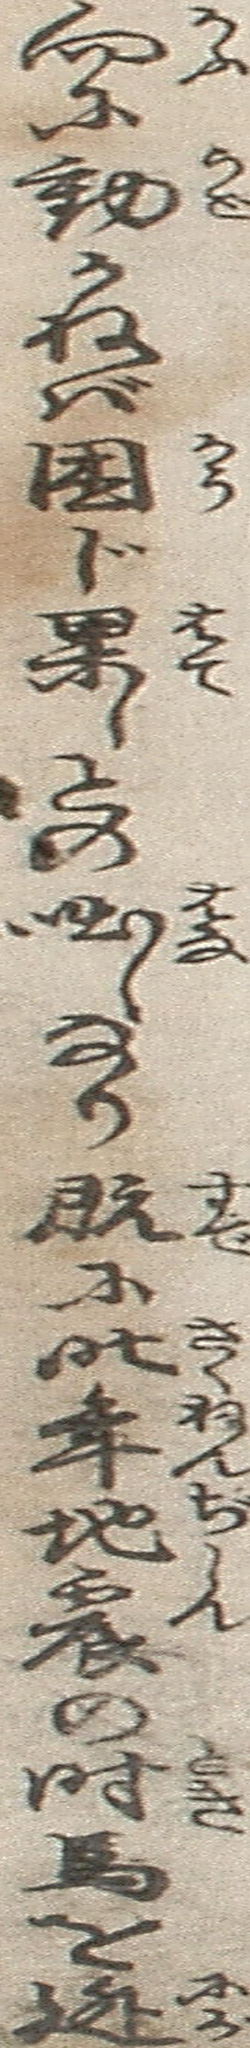向に動かねバ困じ果しとの咄しなり既に昨年地震の時馬を逃

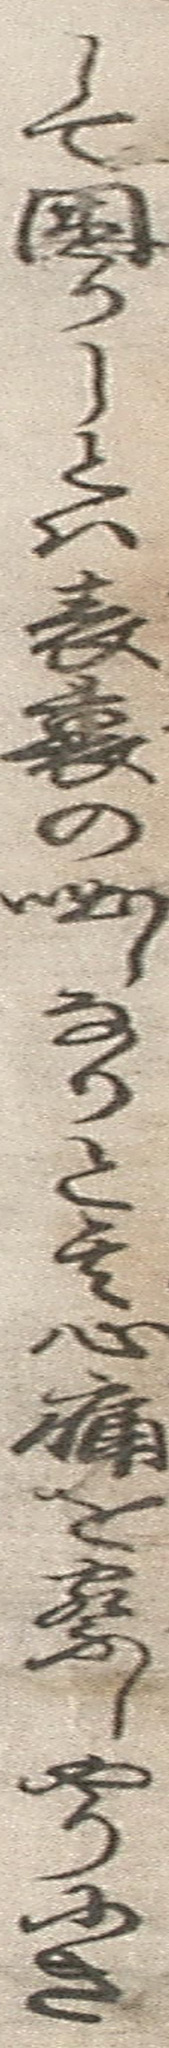して困りしことハ表裏の咄しなりと其心痛を察しやりにき
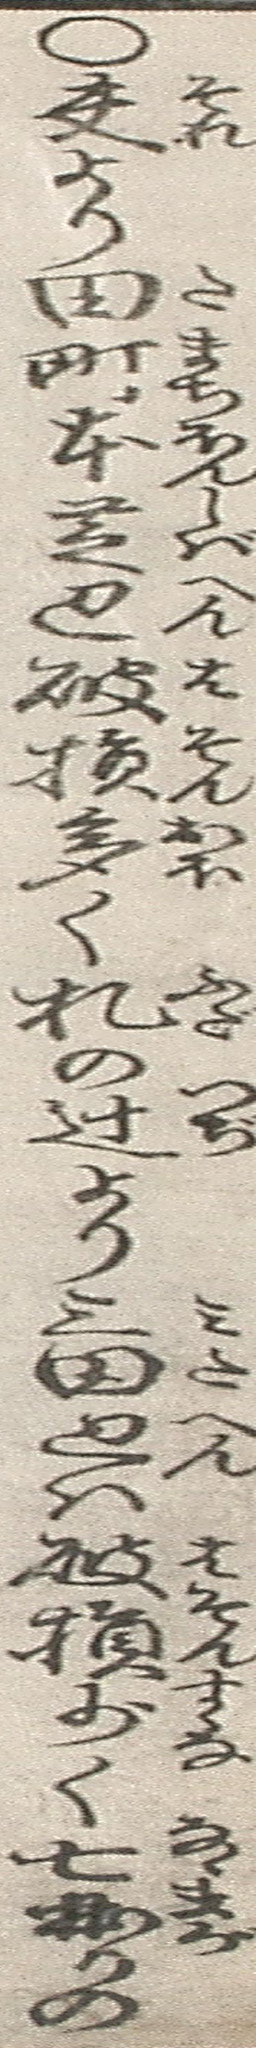◯夫より田町本芝辺破損多く札の辻より三田辺ハ破損少く七曲りの
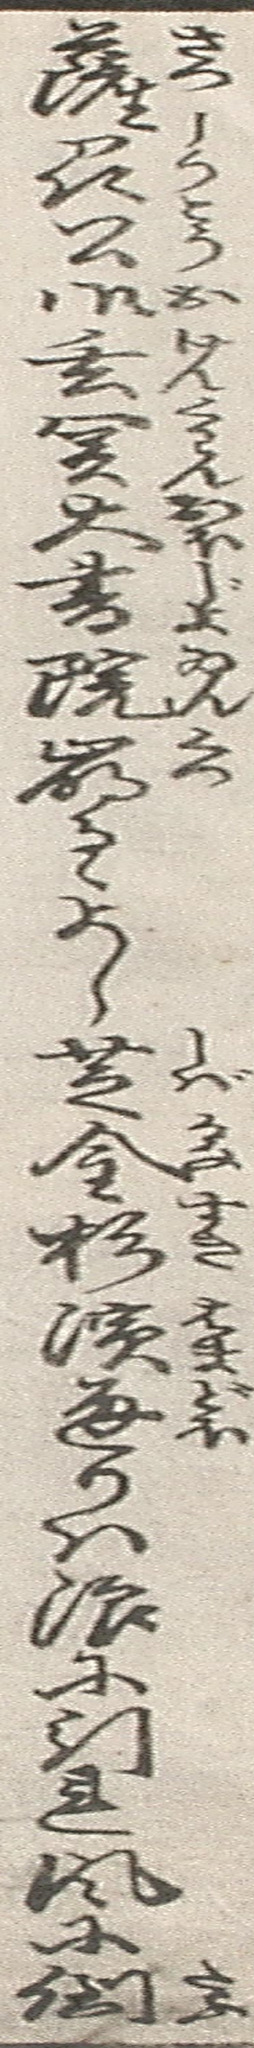薩州公御玄関大書院崩るゝよし芝金杉濱通りハ浪に引れ風に倒
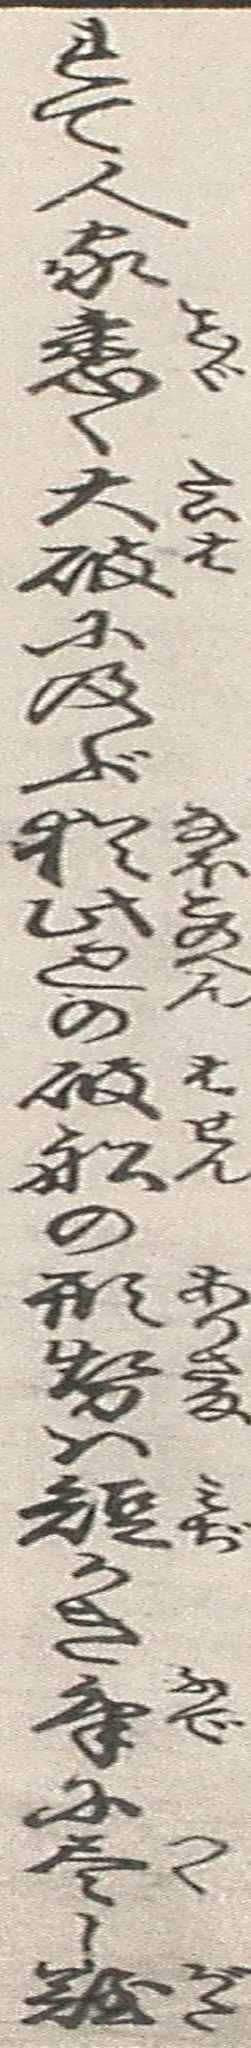れて人家悉く大破に及ぶ猶此辺の破船の形勢ハ短き筆に尽し難
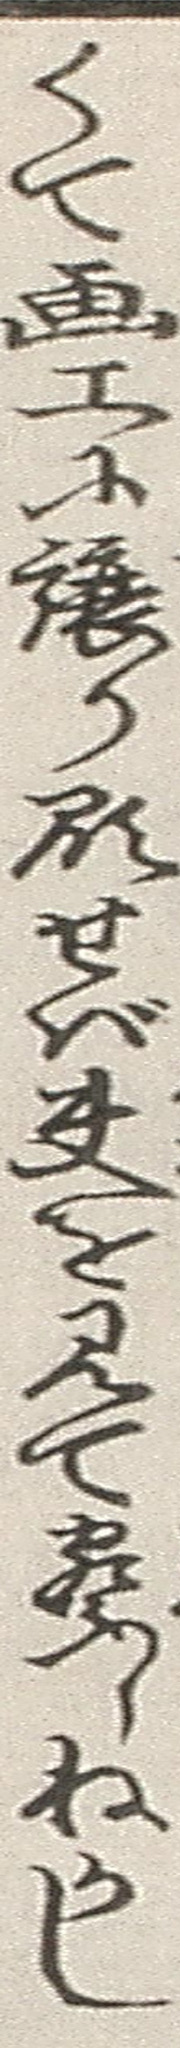くて画工に譲り顕せバ夫を見て察しねかし
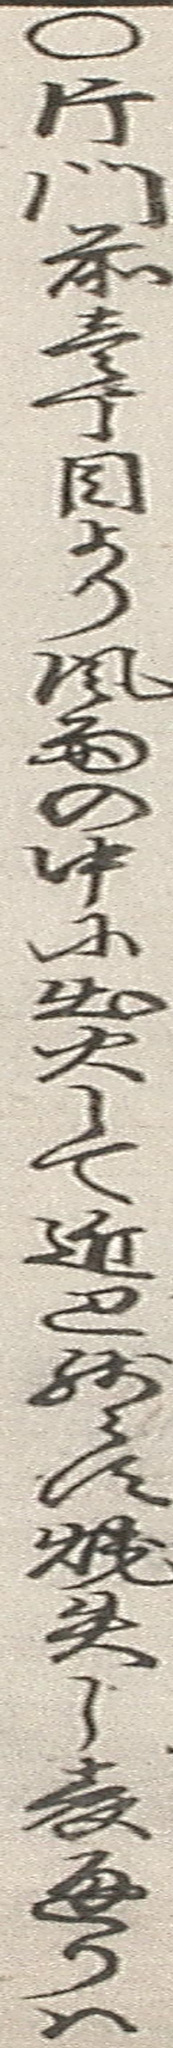◯片門前壱丁目より風雨の中に出火して近辺残らす焼失し表通りハ
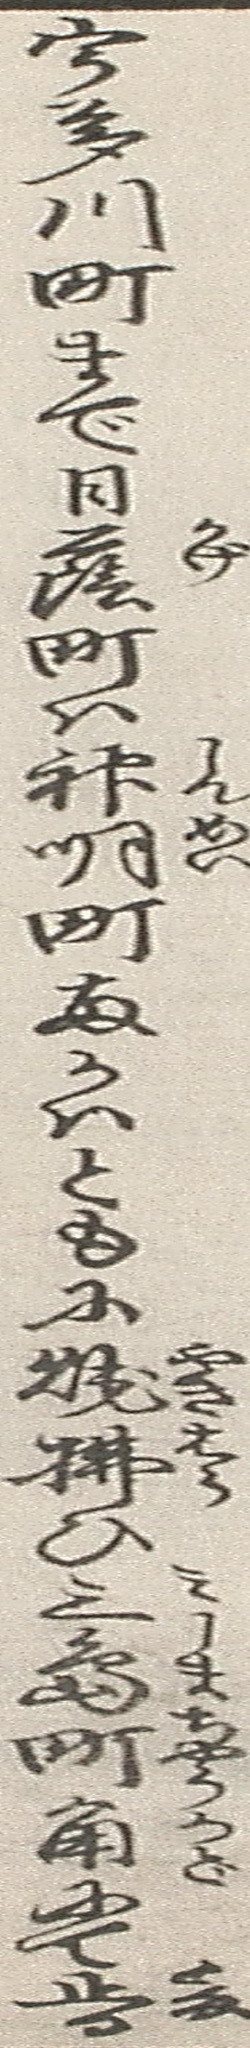宇多川町まで日陰町ハ神明町両かハともに焼払ひ三島町角にて止る
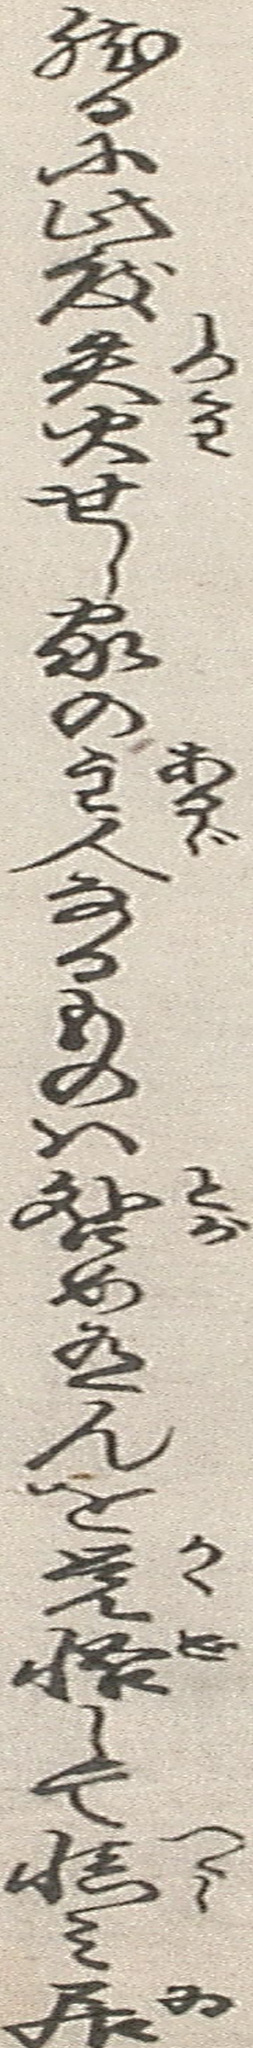然るに此度失火せし家の主人なるものハ咎め有んを覚悟して慎ミ居
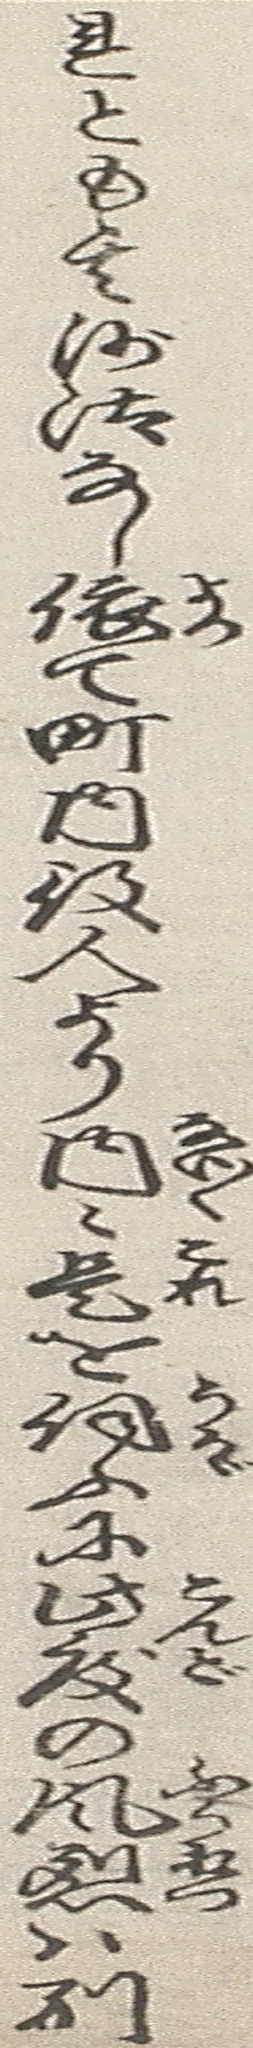れとも其沙汰なし依て町内役人より内々是を伺ふに今度の風烈ハ別
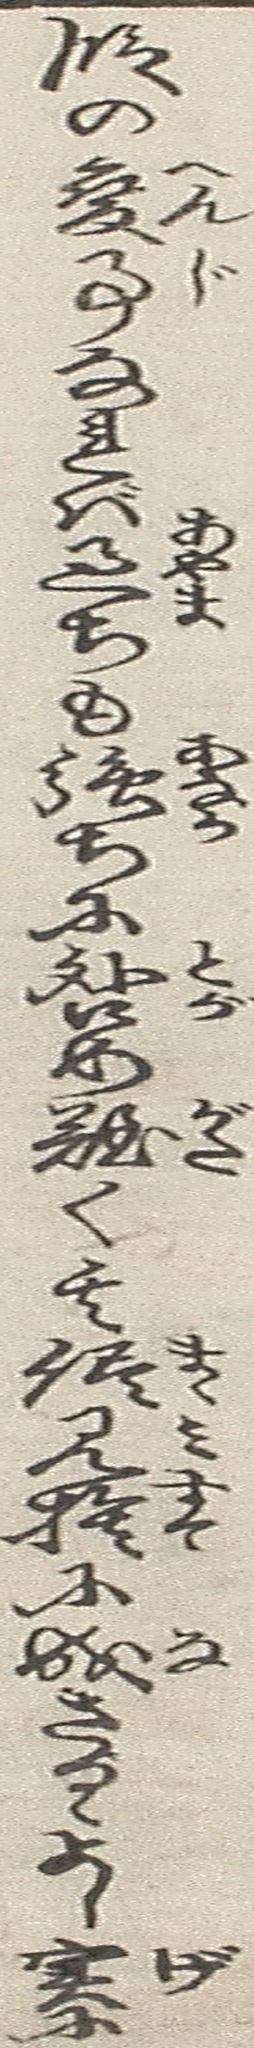段の変事なれバ過ちも強ちに咎め難く其侭見捨に成さるゝよし実に
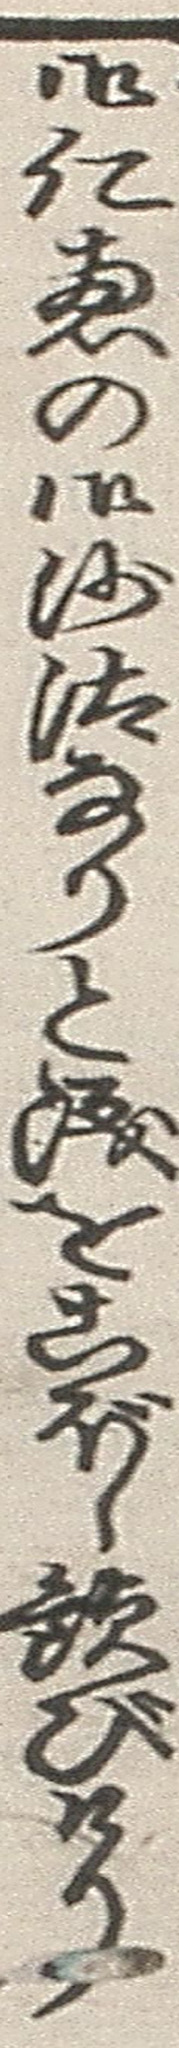御仁恵の御沙汰なりと涙をこぼし歓びけり
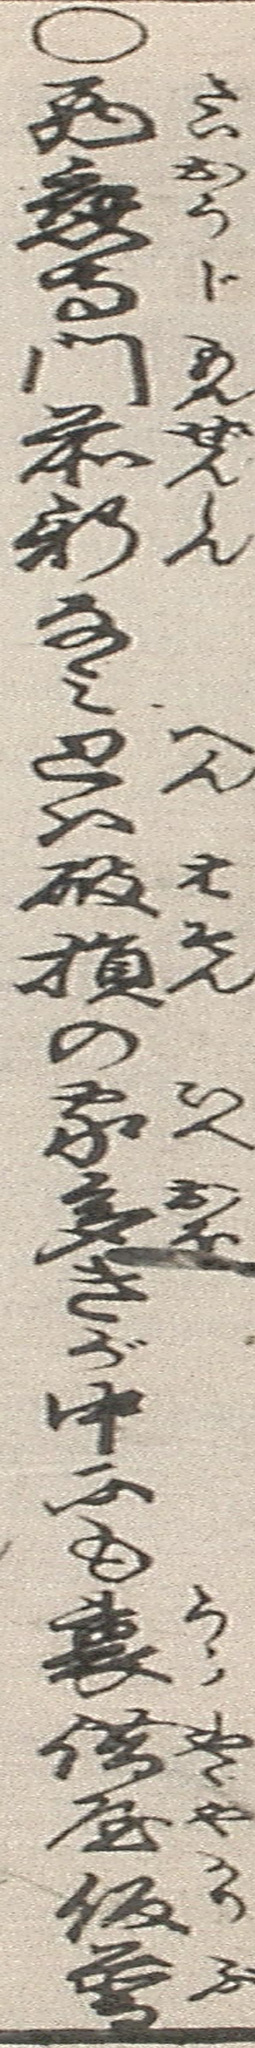◯西応寺門前新なミ辺ハ破損の家多きが中にも裏借家仮普
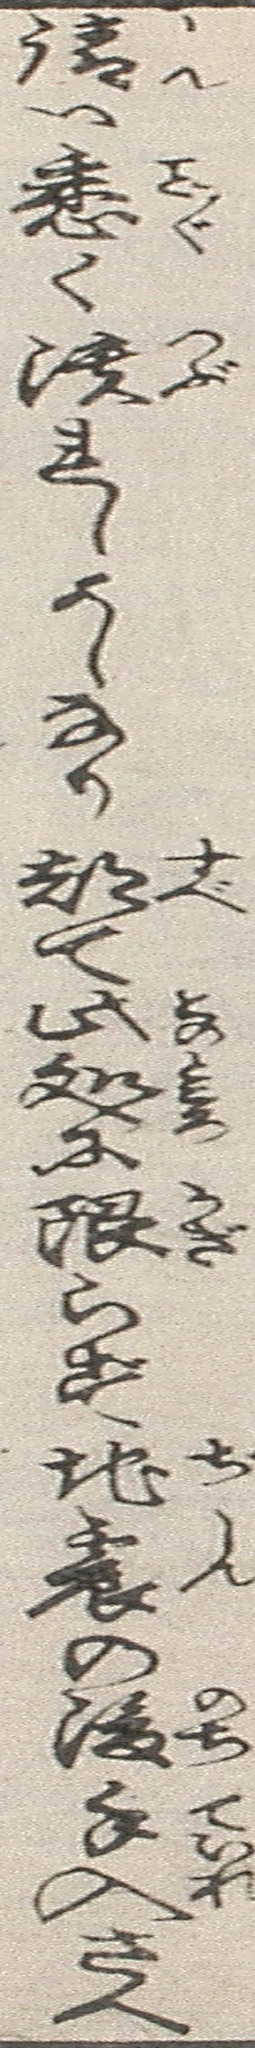請ハ悉く潰れしよしなり都て此処に限らず地震の後手入さへ
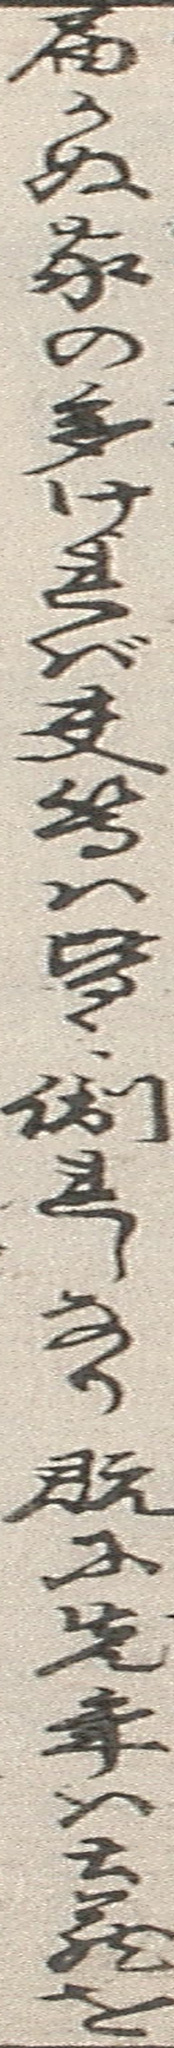届かぬ家の多けれバ夫等ハ皆々倒れしなり既に先年ハ土蔵を
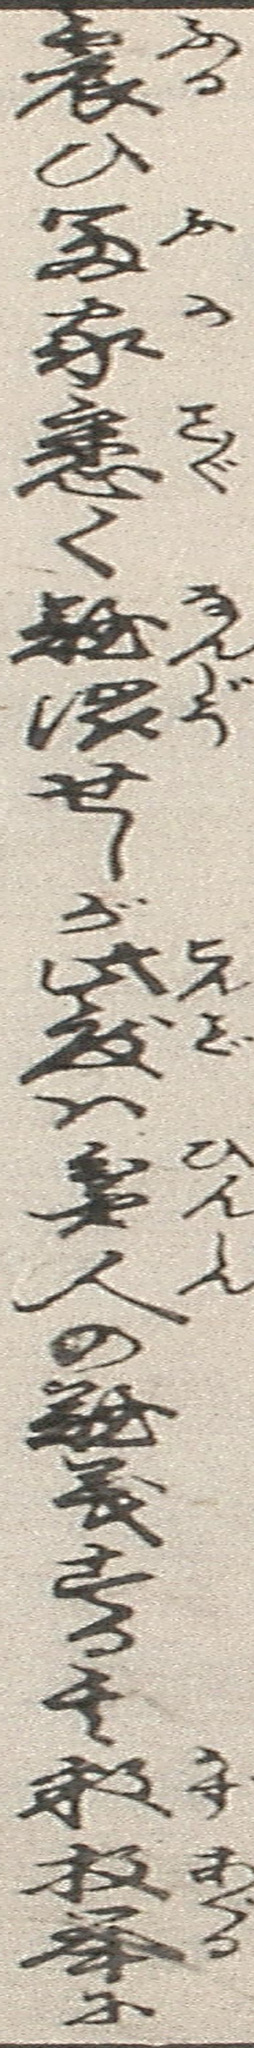震ひ富家悉く難渋せしが今度は貧人の難義する其数枚挙に
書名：安政風聞集　上中下　全
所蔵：東京大学地震研究所図書室 Earthquake Research Institute Library, The University of Tokyo, JAPAN
